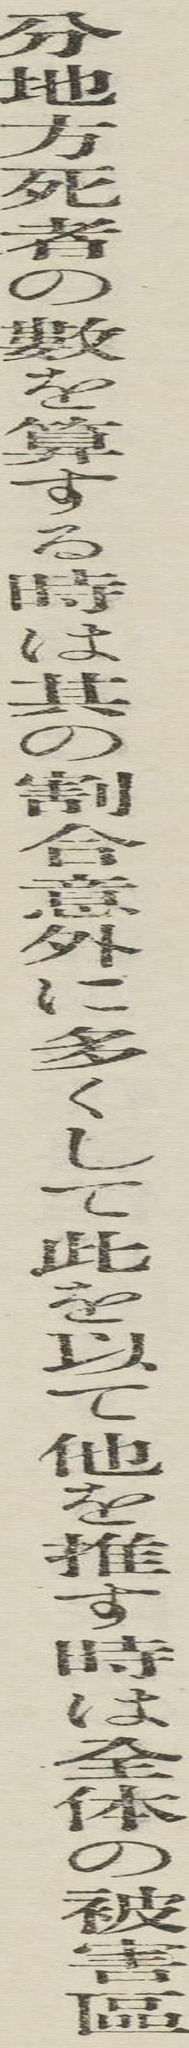分地方死者の数を算する時は其の割合意外に多くして此を以て他を推す時は全体の被害区
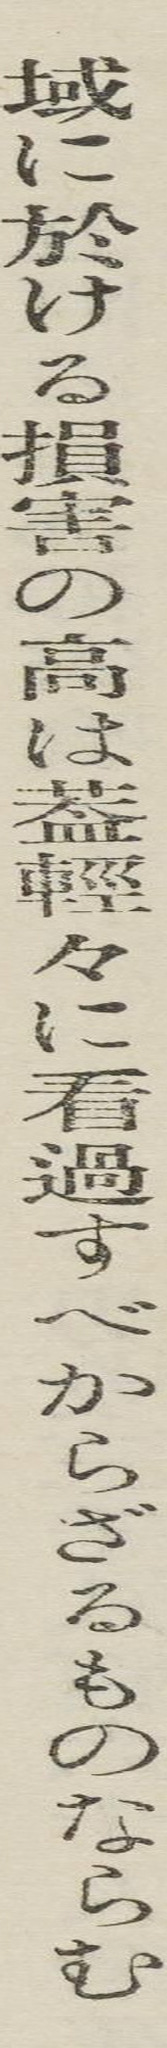域に於ける損害の高は葢軽々に看過すべからざるものならむ
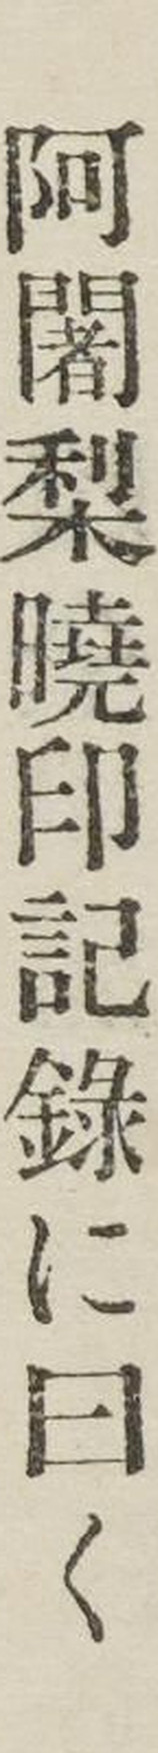阿闍梨暁印記録に曰く
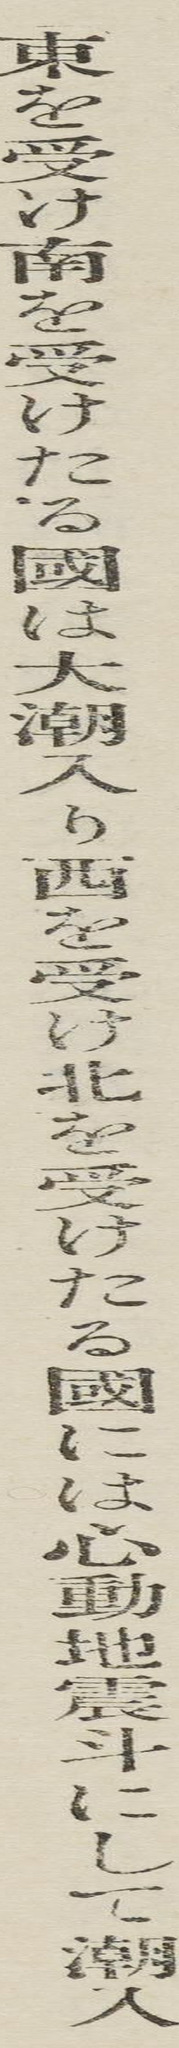東を受け南を受けたる国は大潮入り西を受け北を受けたる国には心動地震斗にして潮入
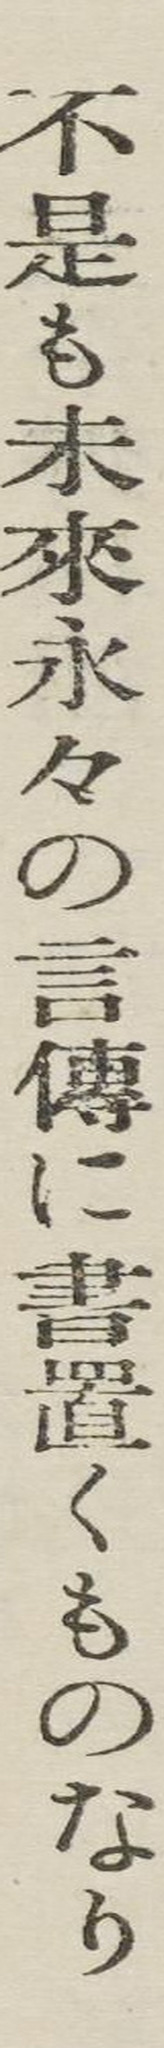不是も未来永々の言伝に書置くものなり
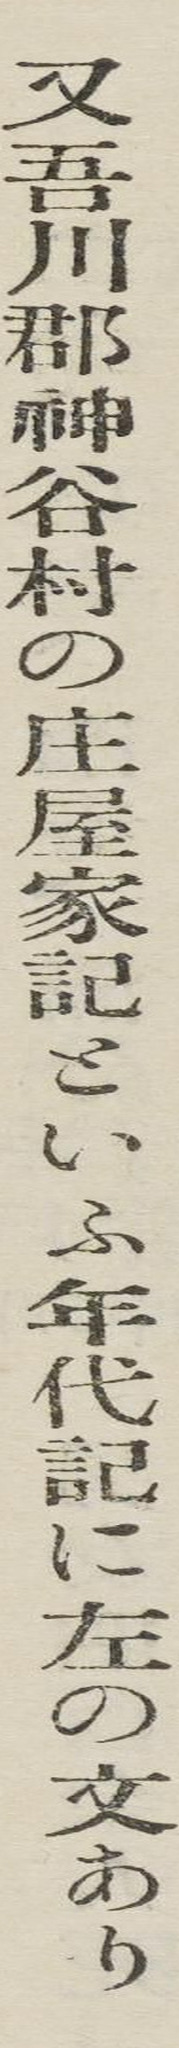又吾川郡神谷村の庄屋家記といふ年代記に左の文あり
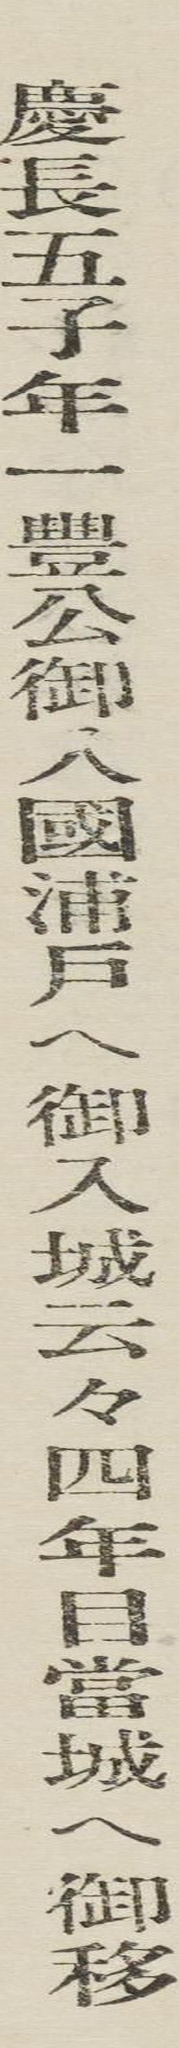慶長五子年一豊公御入国浦戸へ御入城云々四年目当城へ御移
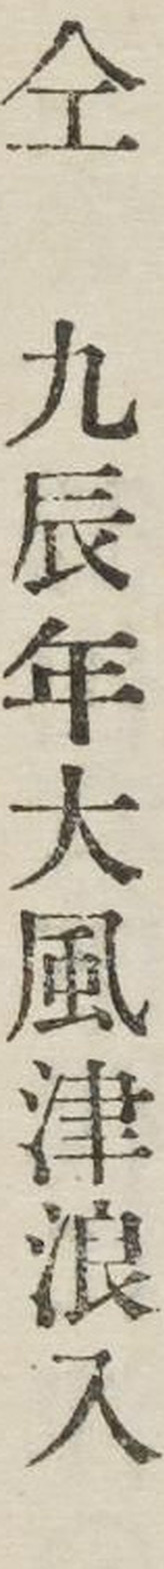同九辰年大風津浪入
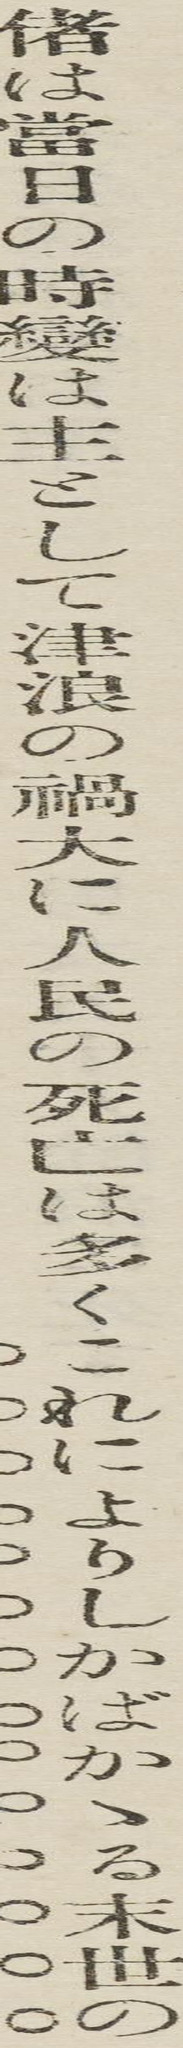偖は当日の時変は主として津浪の禍大に人民の死亡は多くこれによりしかばかゝる末世の
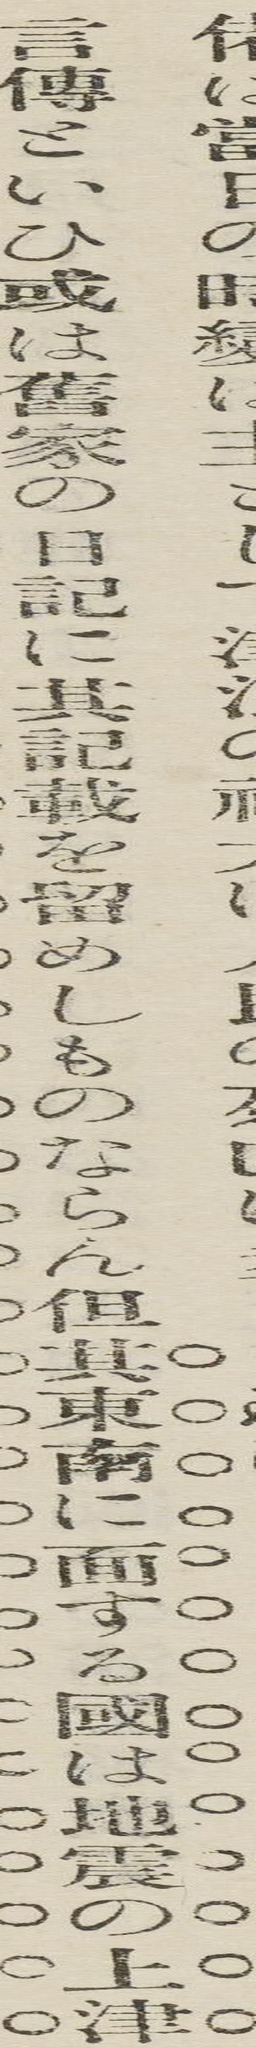言伝といひ或は旧家の日記に其記載を留めしものならん但其東南に面する国は地震の上津
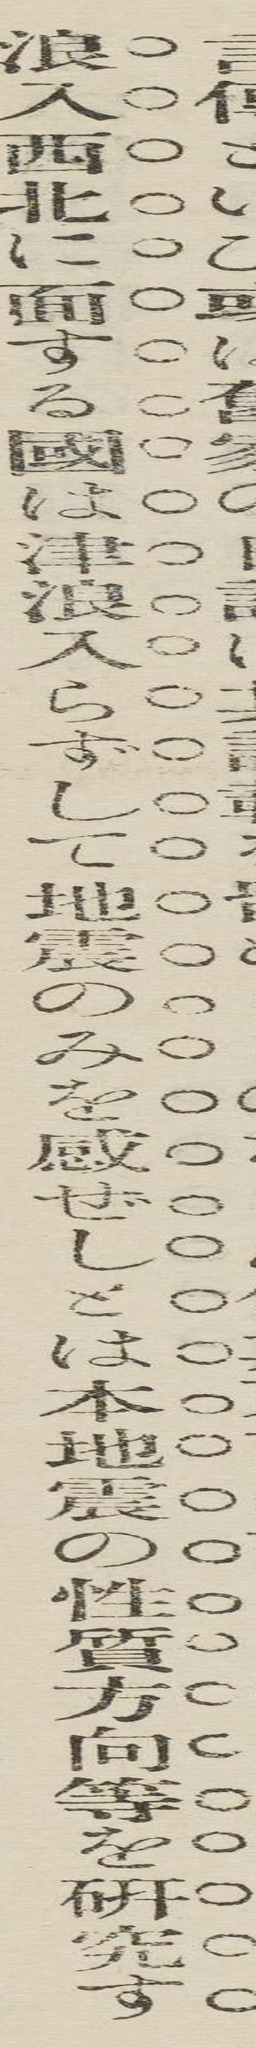浪入西北に面する国は津浪入らずして地震のみを感ぜしとは本地震の性質方向等を研究す
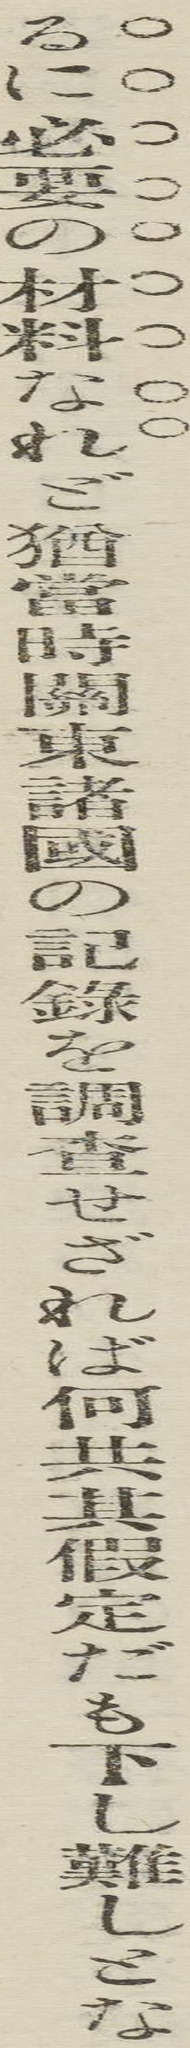るに必要の材料なれど猶当時関東諸国の記録を調査せざれば何共其仮定だも下し難しとな
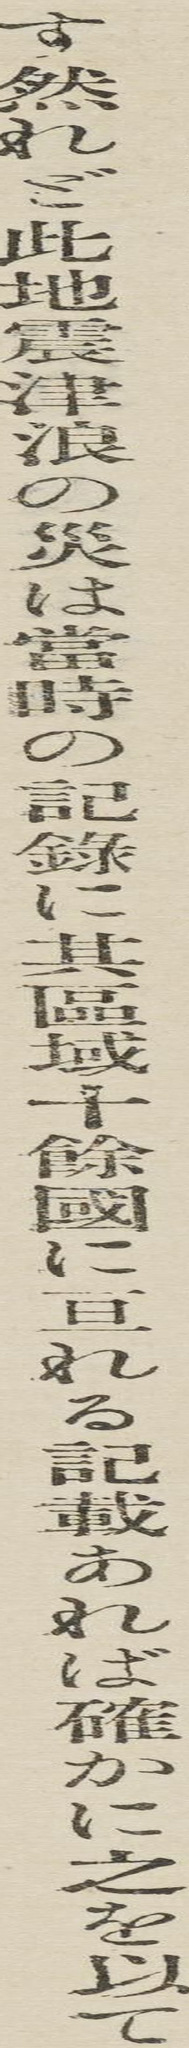す然れど此地震津浪の災は当時の記録に其区域十余国に亘れる記載あれば確かに之を以て
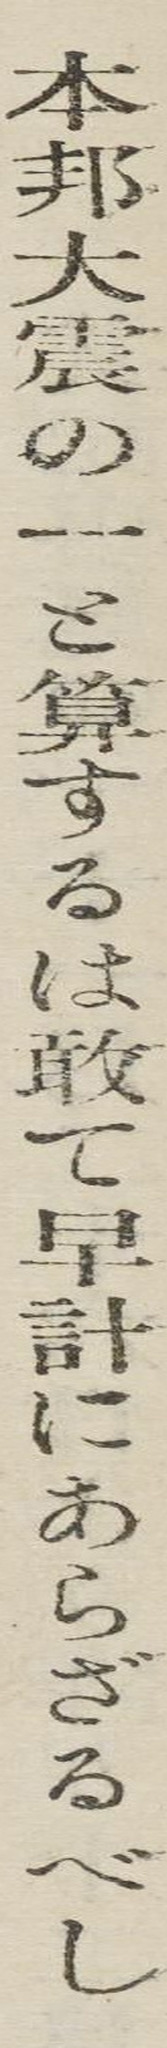本邦大震の一と算するは敢て早計にあらざるべし
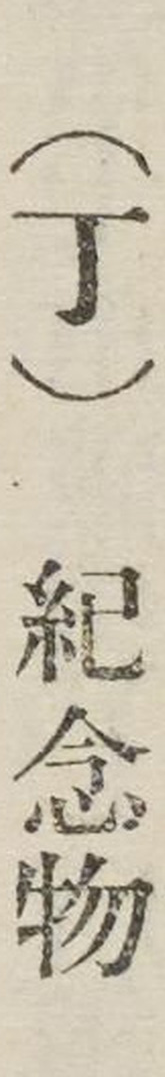紀念物
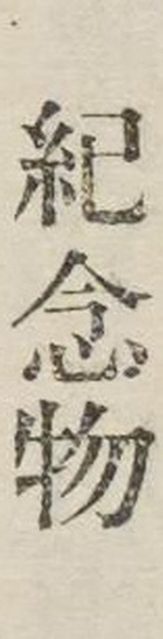紀念物
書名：土佐古今ノ地震
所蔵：東京大学地震研究所図書室 Earthquake Research Institute Library, The University of Tokyo, JAPAN
